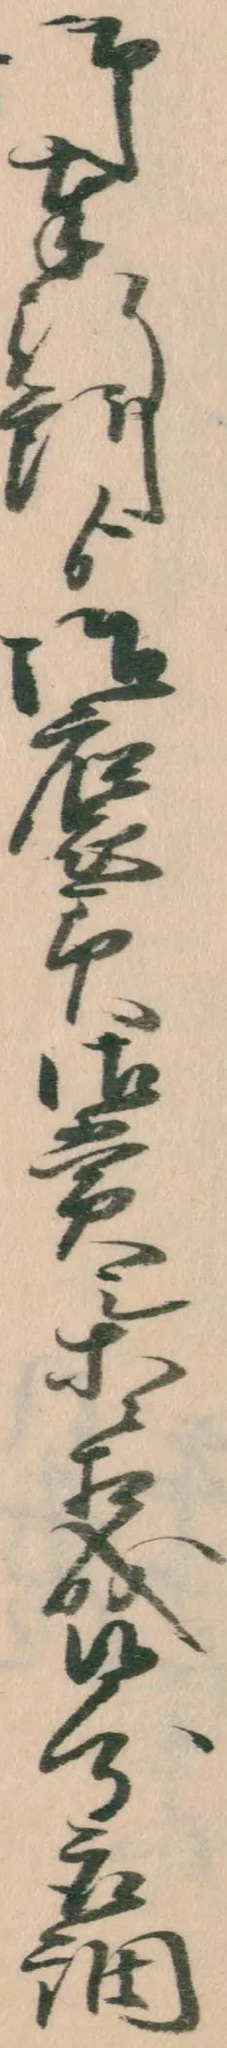御奉行所ゟ御褒美御賞シ等ニ相成候分取調
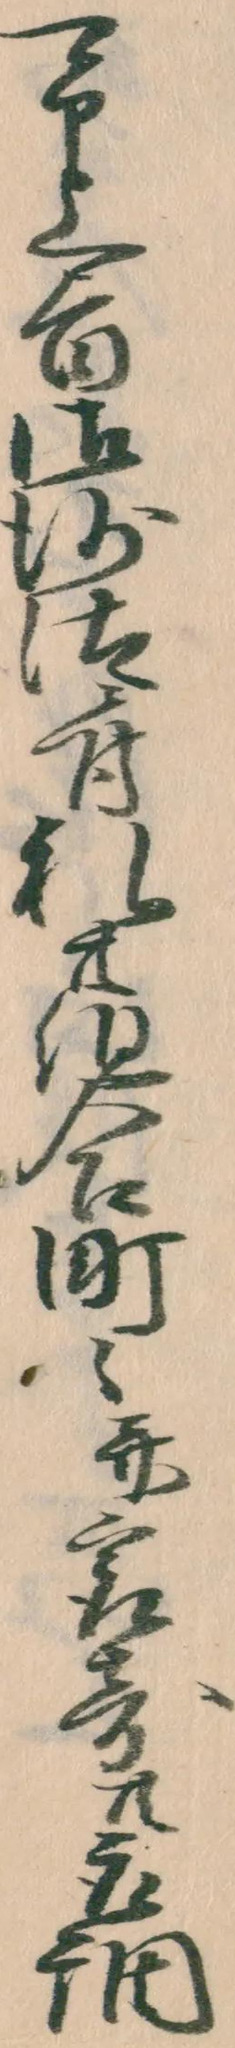可申上旨御沙汰ニ付私共組合町々并最寄共取調
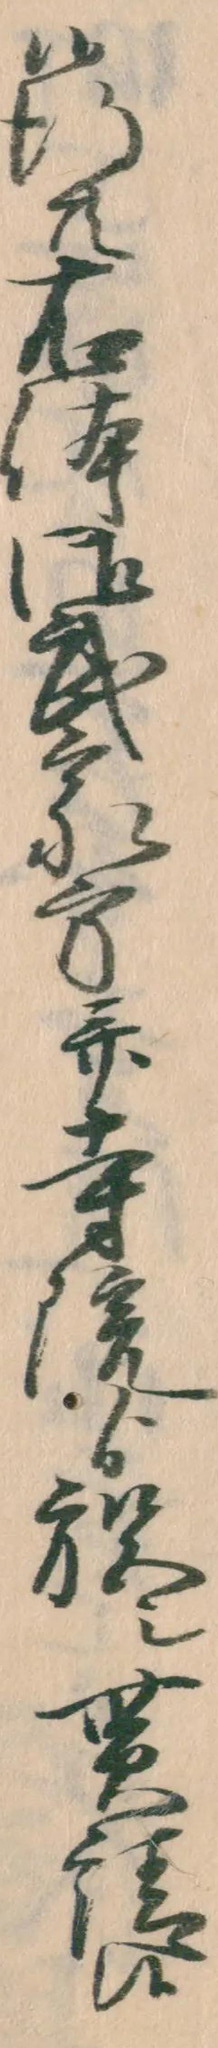候得共右体御武家方并寺院ゟ施シ貰請候

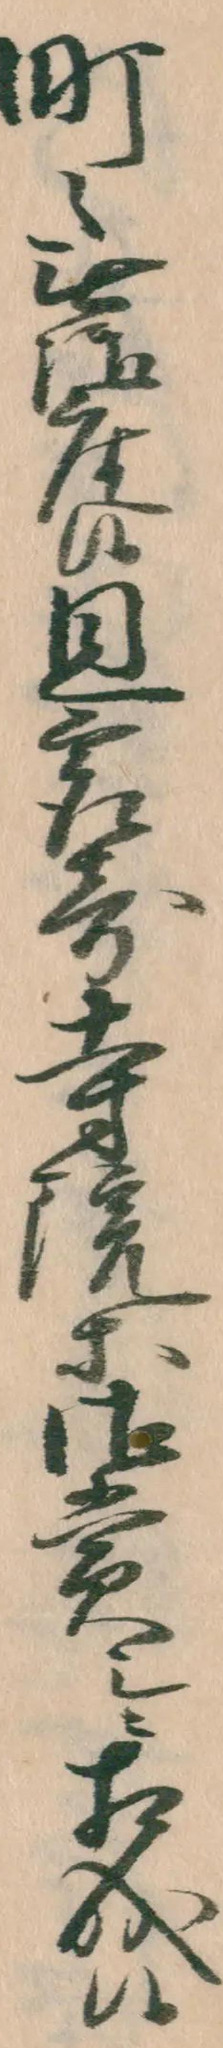町々無御座候且最寄寺院等御賞シニ相成候
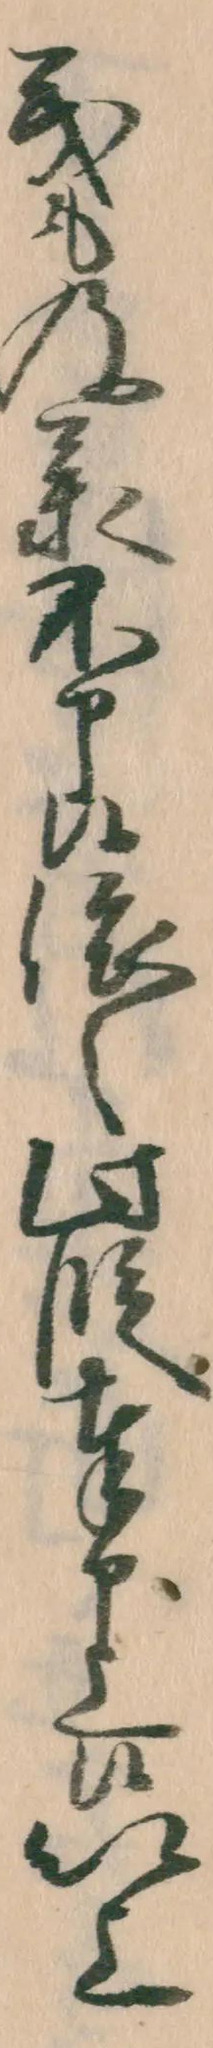義も及承不申候依之此段奉申上候以上
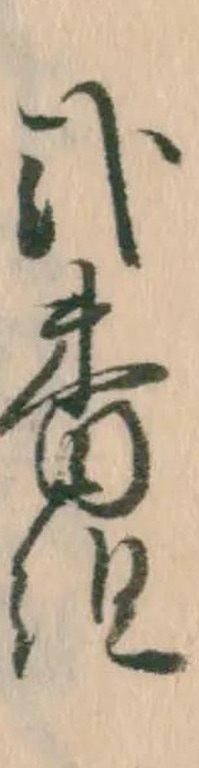弐番組
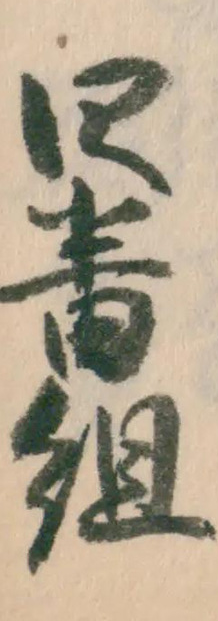四番組

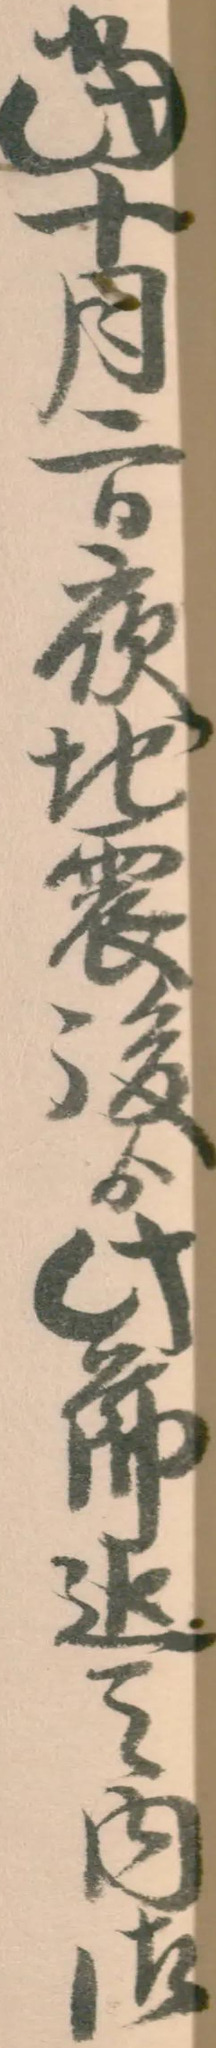当十月二日夜地震後ゟ此節追之内御
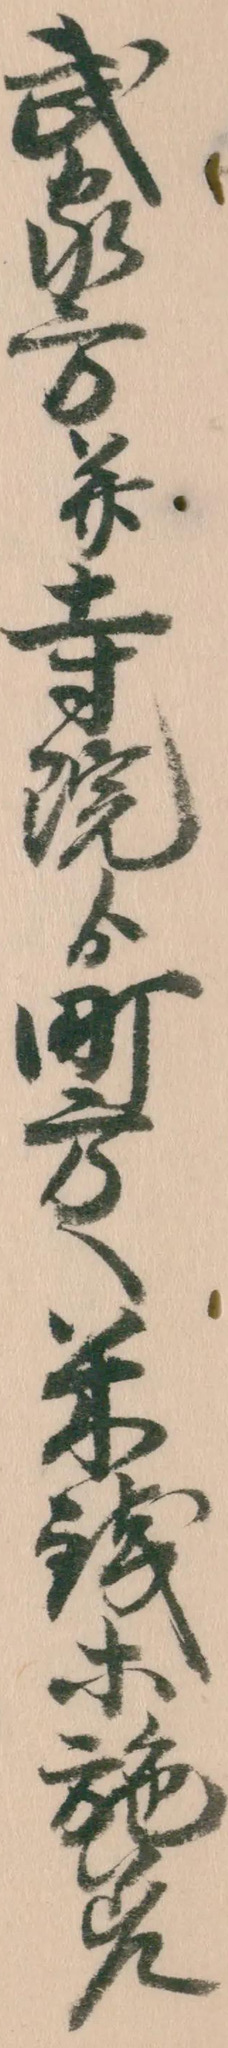武家方并寺院ゟ町方へ米銭等施差
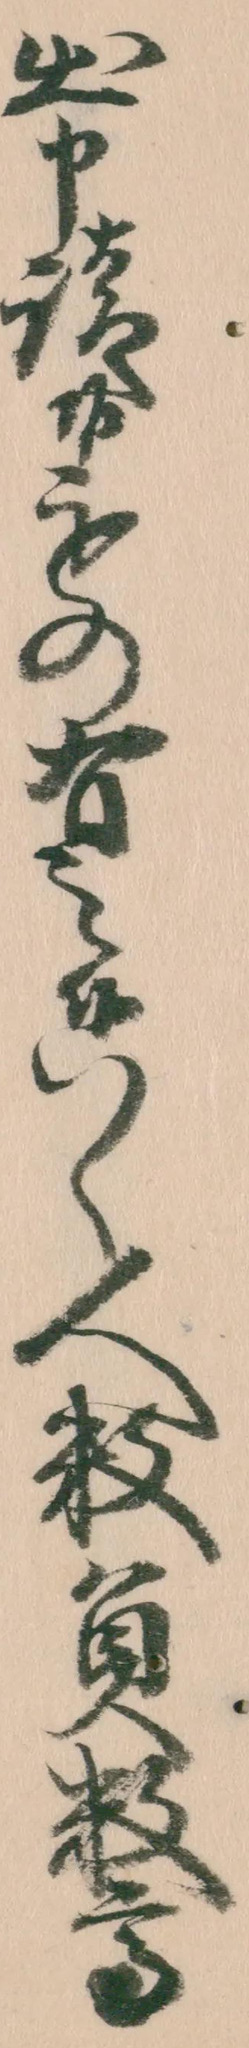出申談候もの有之候ハヽ人数員数高
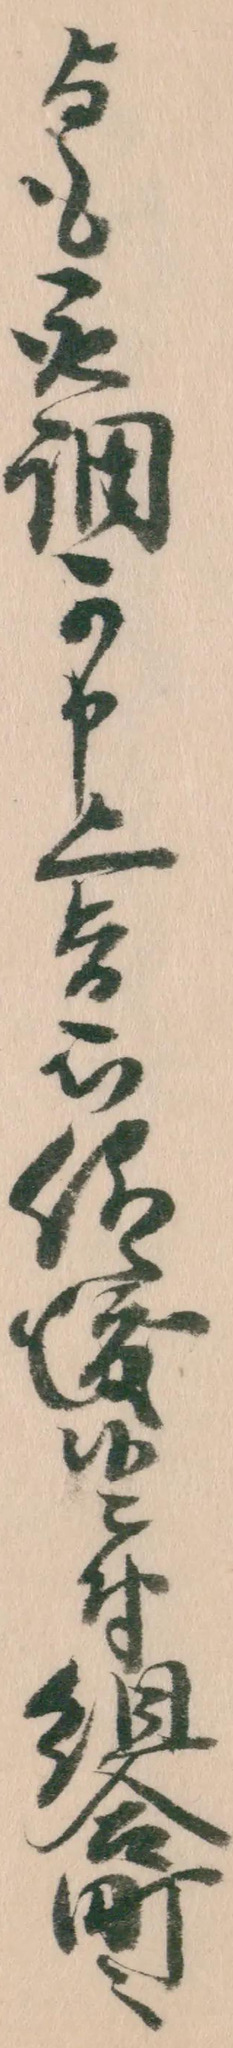とも取調可申上旨被仰渡候ニ付組合町々
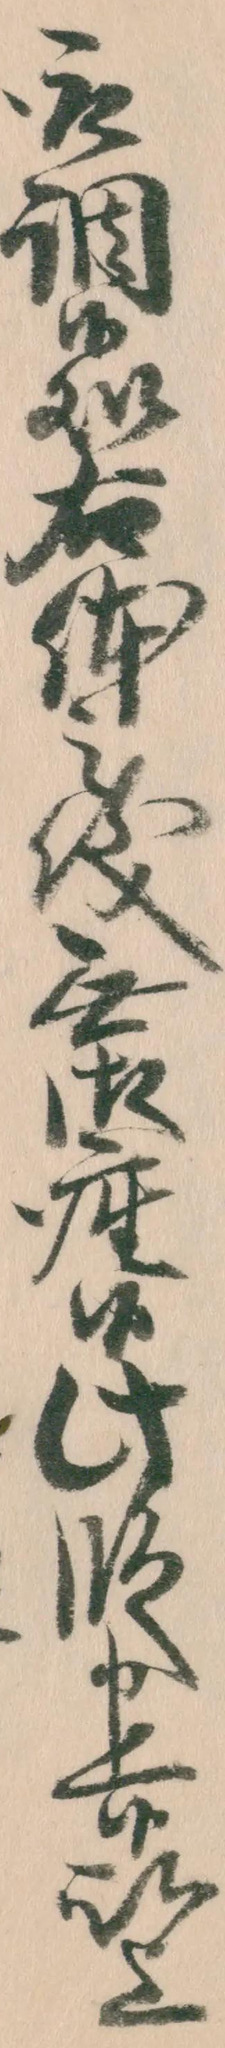取調候処右体之儀無御座候此段申上候以上
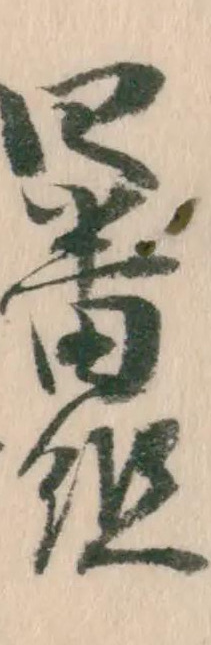四番組
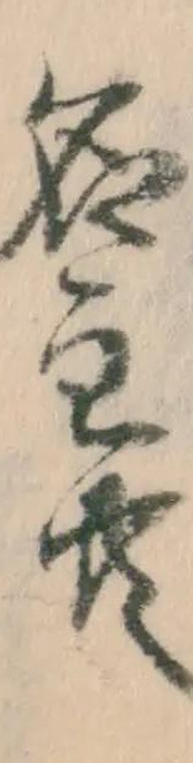名主共

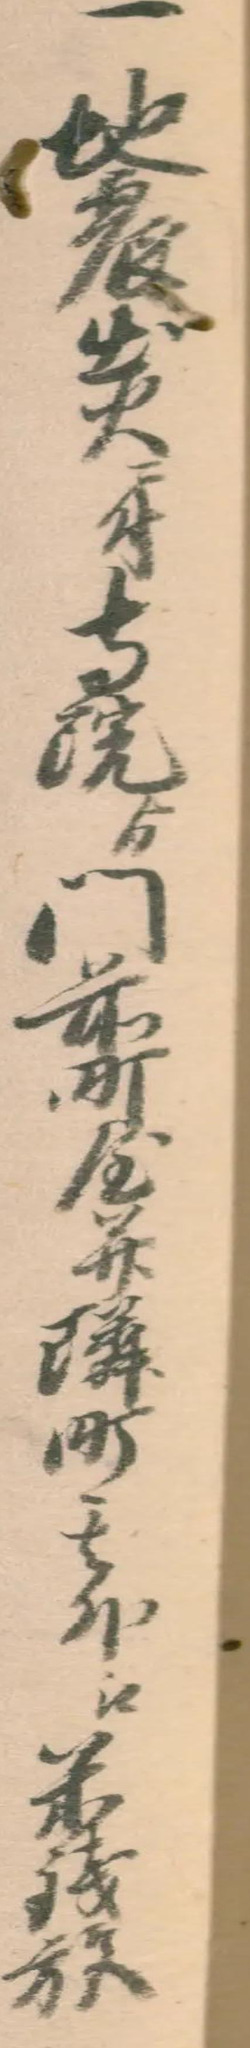一地震出火ニ付寺院ゟ門前町屋并隣町其外え米銭施
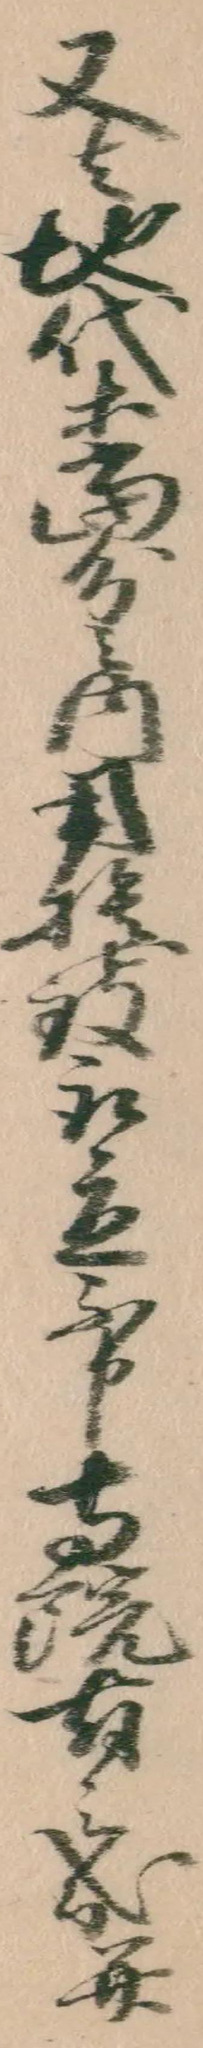又は地代等当分之内用捨致取立不申寺院有之哉并
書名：武家方并寺院等ニテ施差出候一件
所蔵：国立国会図書館 National Diet Library, JAPAN
